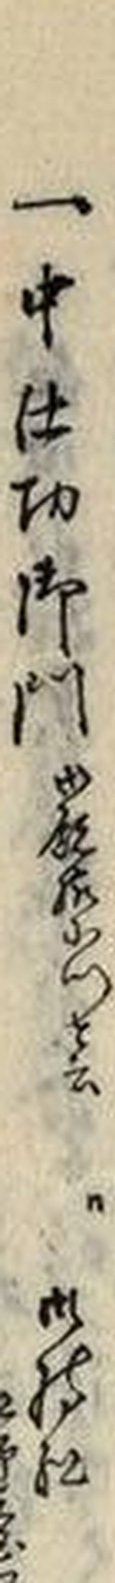一中仕切御門御厩脇小門共云同御持組
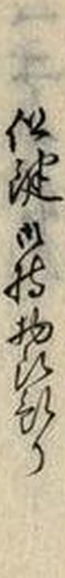但鍵御留守物頭預り
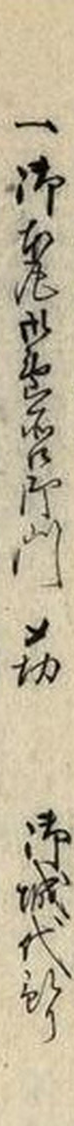一御本丸御台所口御門〆切御城代預り
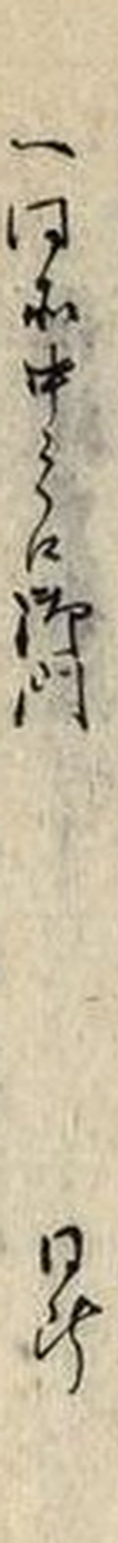一同所中之口御門同断
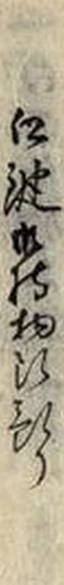但鍵御留守物頭預り
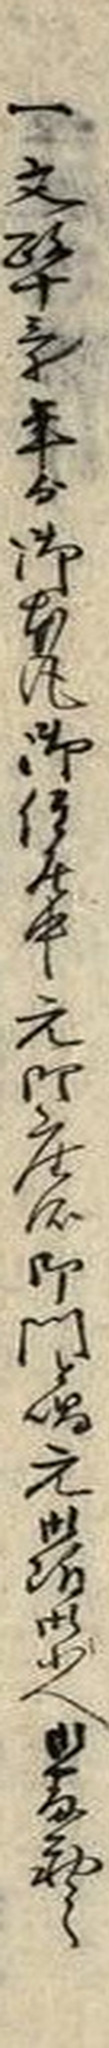一文政十三寅年ゟ御本丸御住居中元御座所御門と唱元御附御小人御番勤之
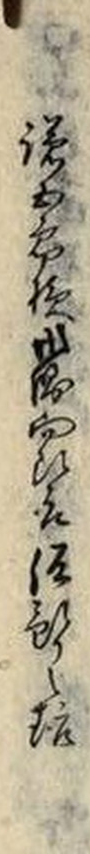謙五郎様御側向頭取仮預り之趣

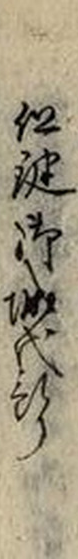但鍵御裏役預り
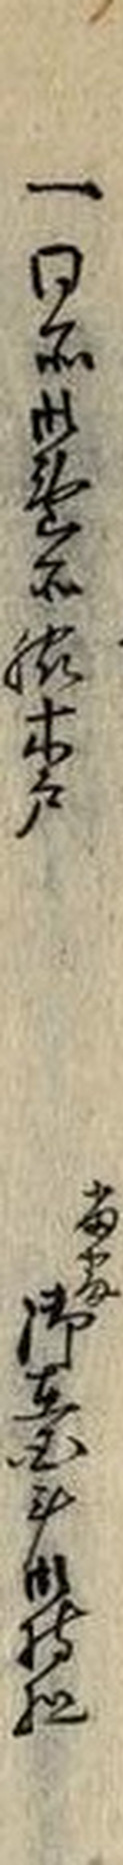一同所御台所脇木戸当番御在国斗御持組
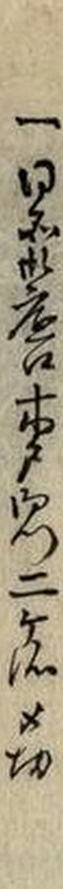一同所御庭口木戸御門二ケ所〆切
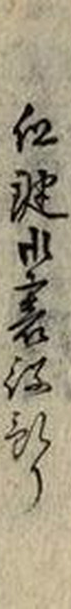但鍵御裏役預り
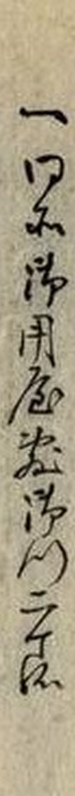一同所御用屋敷御門二ケ所
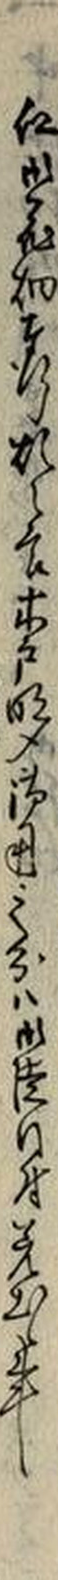但御花畑奉行煩候節木戸明〆御用之分は御徒目付差出候事
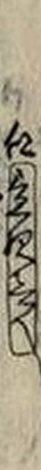但昼夜壱人
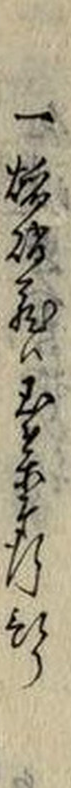一焔硝蔵は玉薬奉行預り
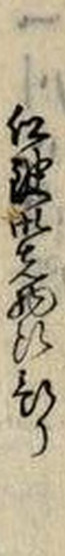但鍵御先物頭預り
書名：御門御櫓之部
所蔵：福井県文書館 Fukui Prefectural Archives
